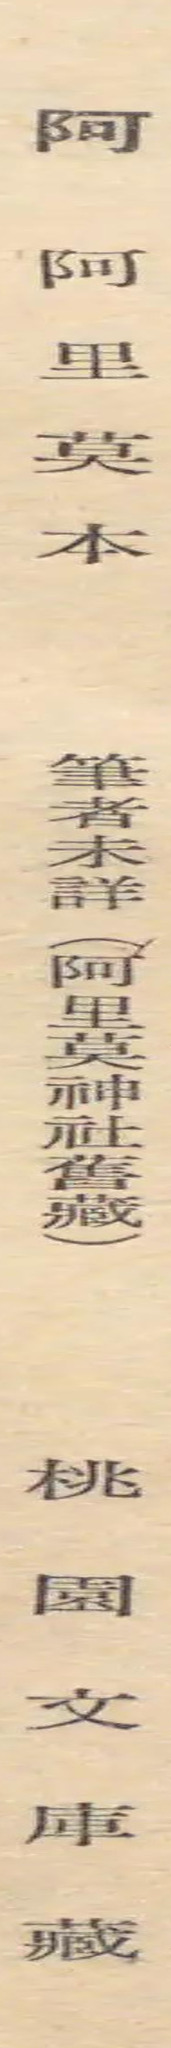阿阿里莫本筆者未詳(阿里莫神社旧蔵)桃園文庫蔵
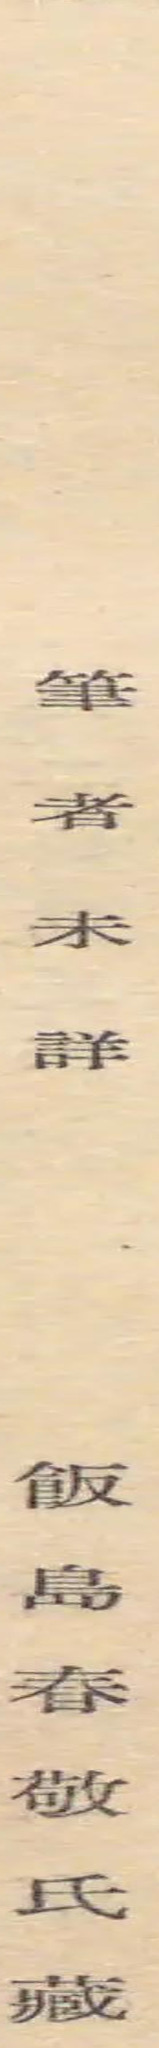飯筆者未詳飯島春敬氏蔵
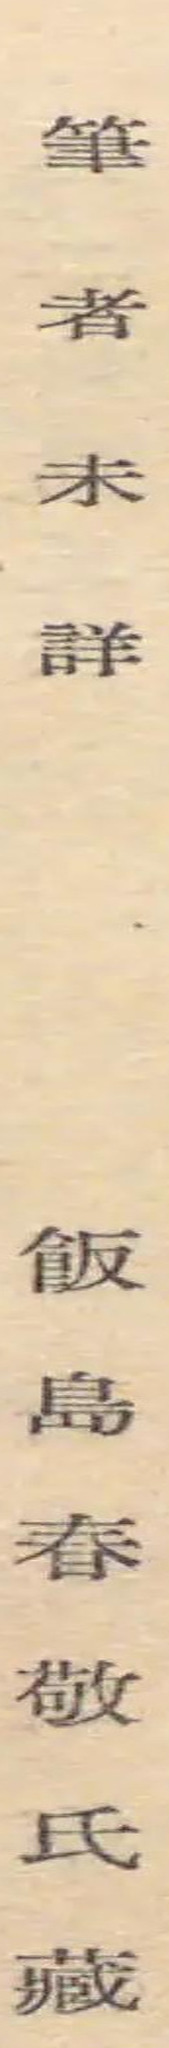飯筆者未詳飯島春敬氏蔵
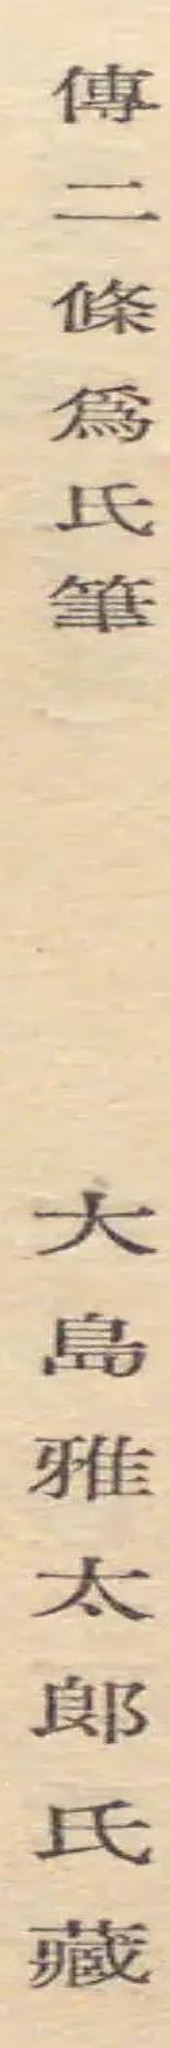谿伝二条為氏筆大島雅太郎氏蔵
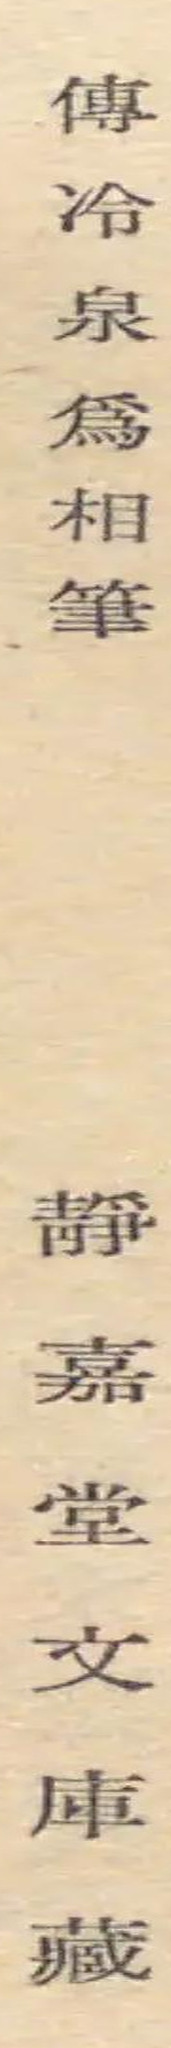相伝冷泉為相筆静嘉堂文庫蔵
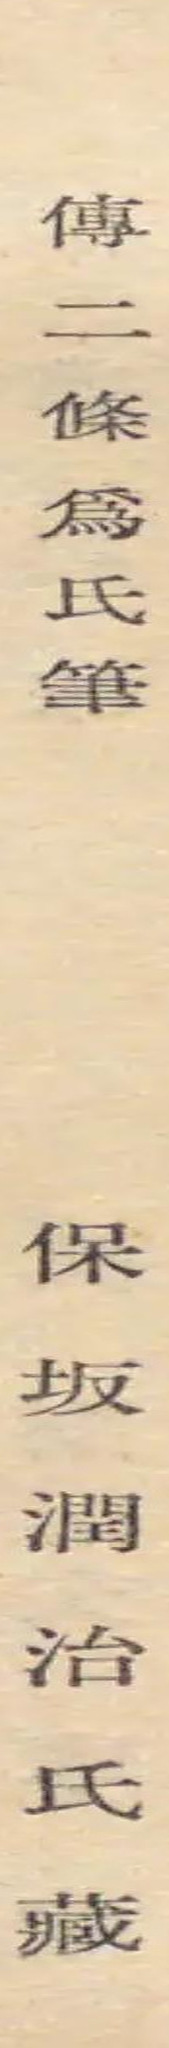坂伝二条為氏筆保坂潤治氏蔵
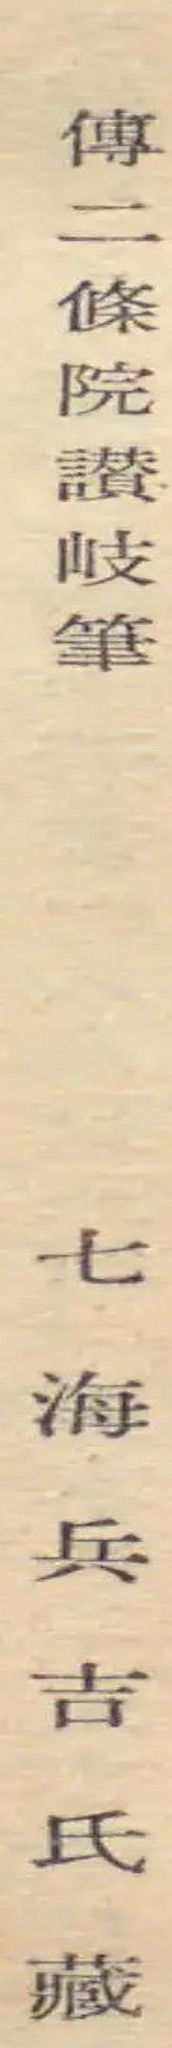讃伝二条院讃岐筆七海兵吉氏蔵
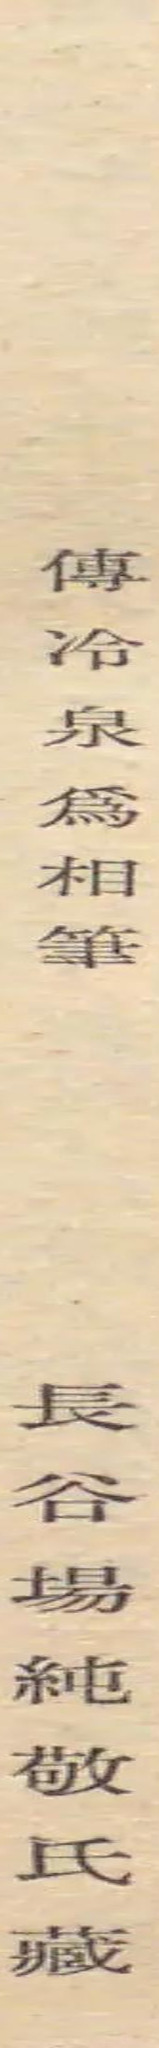長伝冷泉為相筆長谷場純敬氏蔵
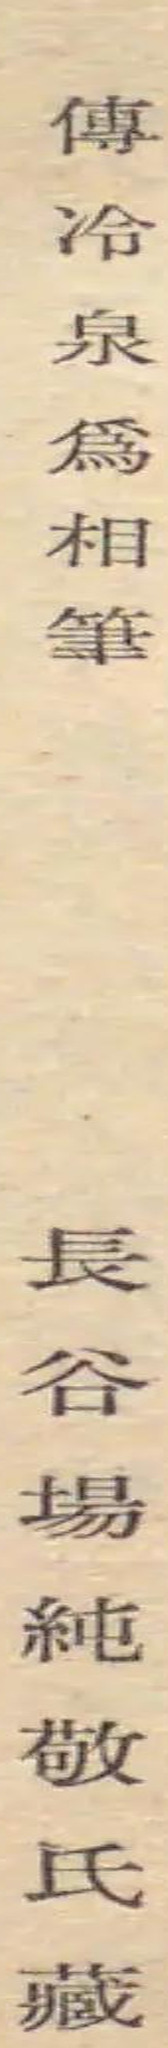長伝冷泉為相筆長谷場純敬氏蔵
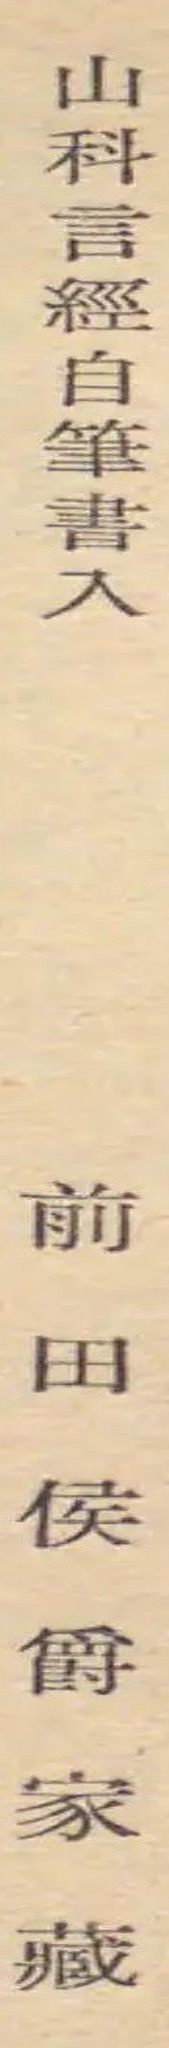言山科言経自筆書入前田侯爵家蔵
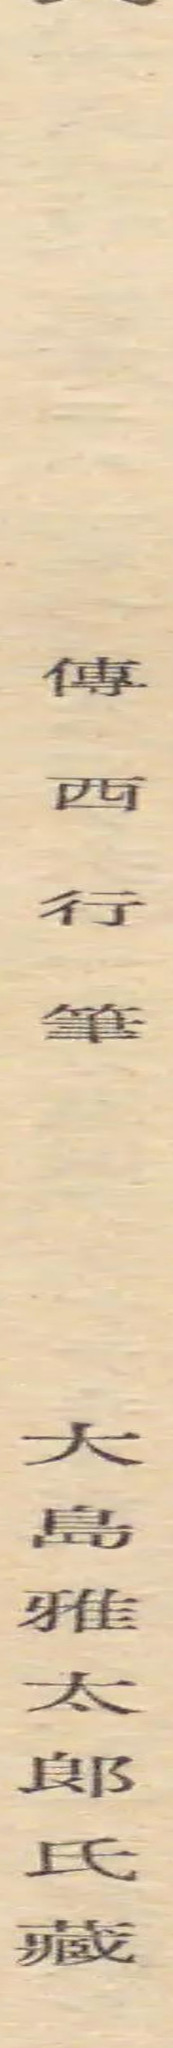大伝西行筆大島雅太郎氏蔵
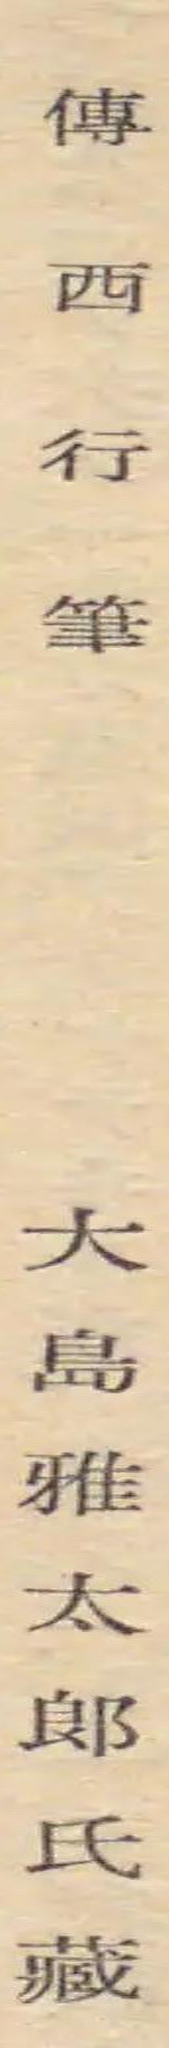大伝西行筆大島雅太郎氏蔵
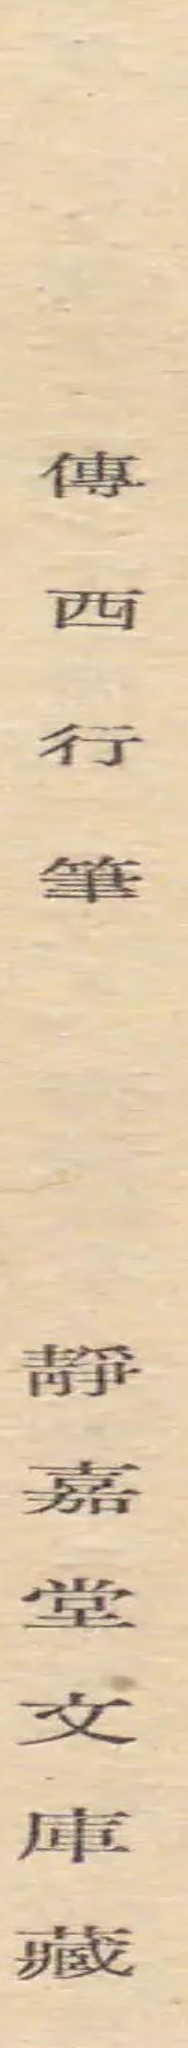西伝西行筆静嘉堂文庫蔵
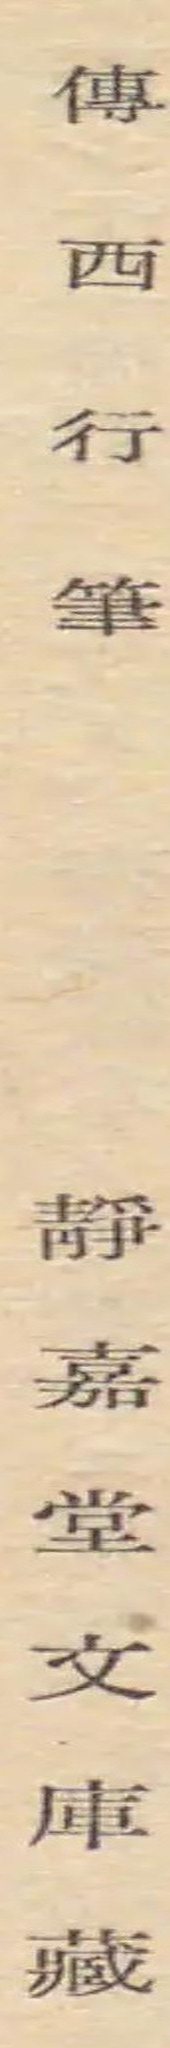西伝西行筆静嘉堂文庫蔵
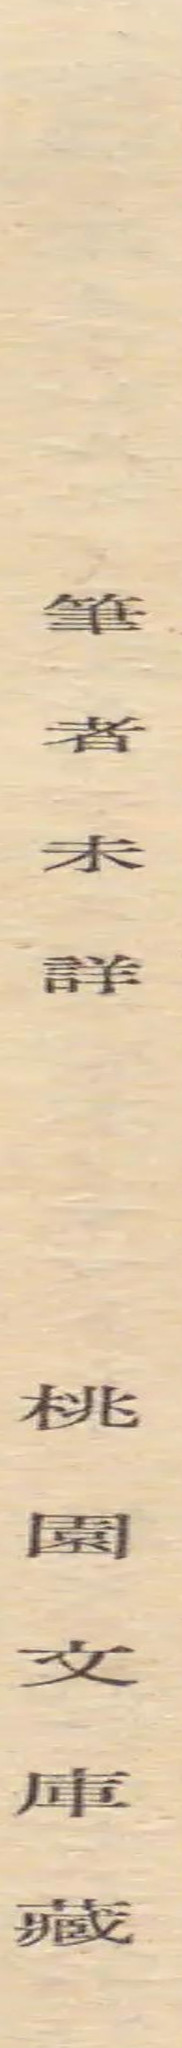桃筆者未詳桃園文庫蔵
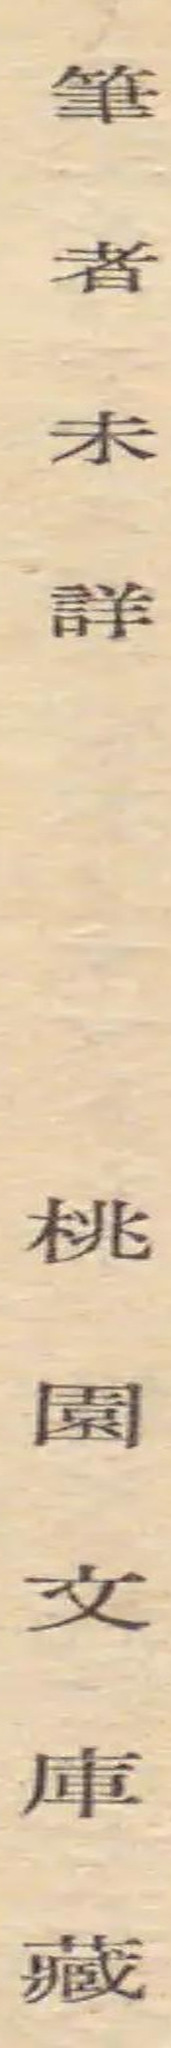桃筆者未詳桃園文庫蔵
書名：校異源氏物語.
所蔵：国立国会図書館 National Diet Library, JAPAN
